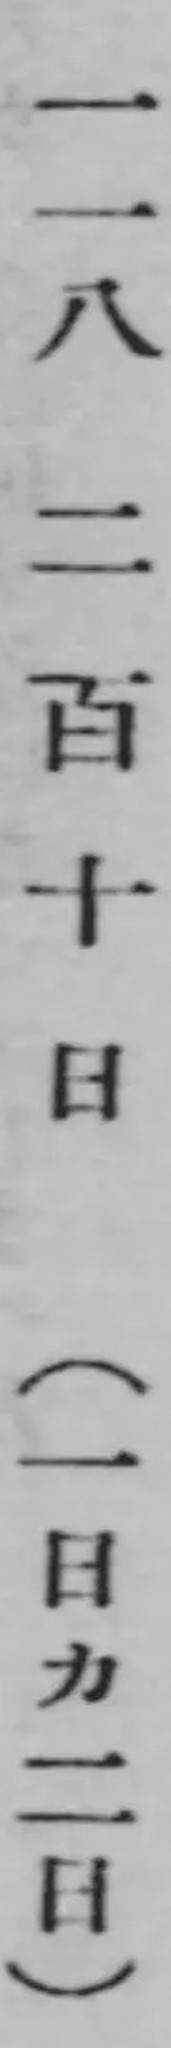一一八二百十日(一日ヵ二日)
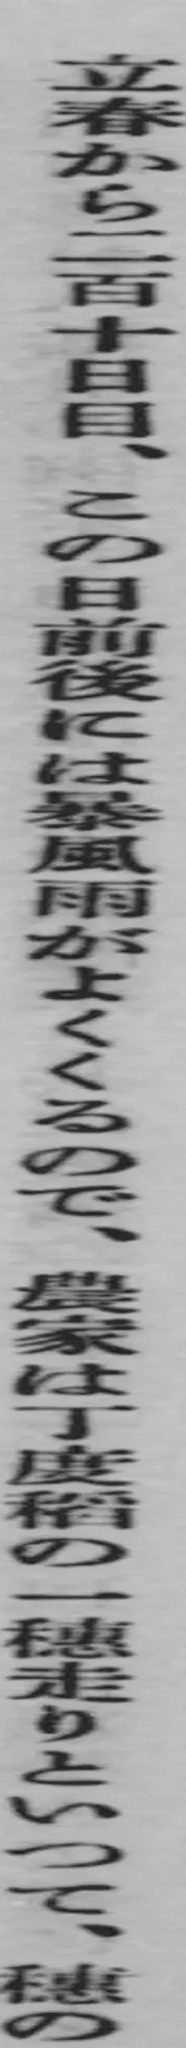立春から二百十日目、この日前後には暴風雨がよくくるので、農家は丁度稻の一穗走りといつて、穗の
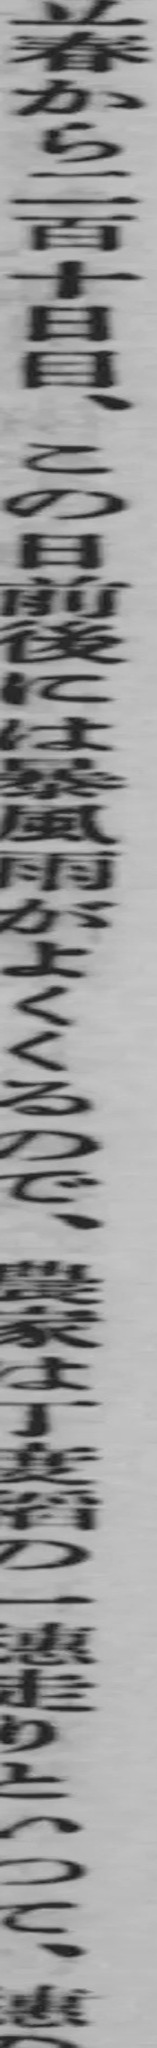立春から二百十日目、この日前後には暴風雨がよくくるので、農家は丁度稻の一穗走りといつて、穗の
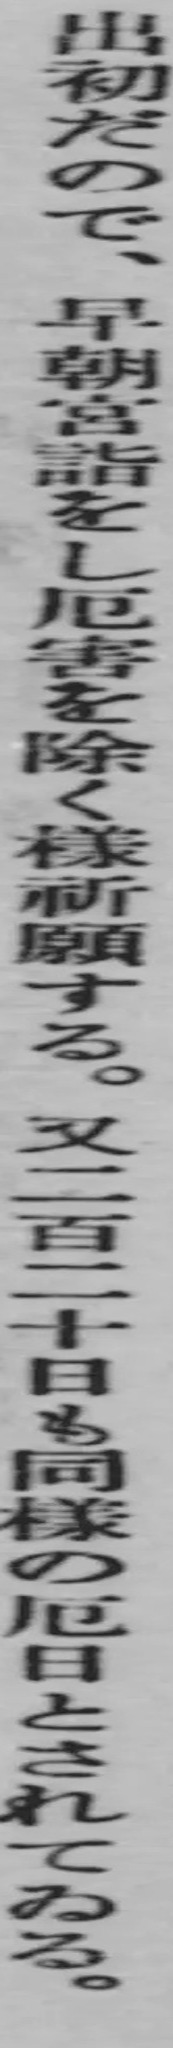出初だので、早朝宮詣をし厄害を除く様祈願する。又二百二十日も同様の厄日とされてゐる。
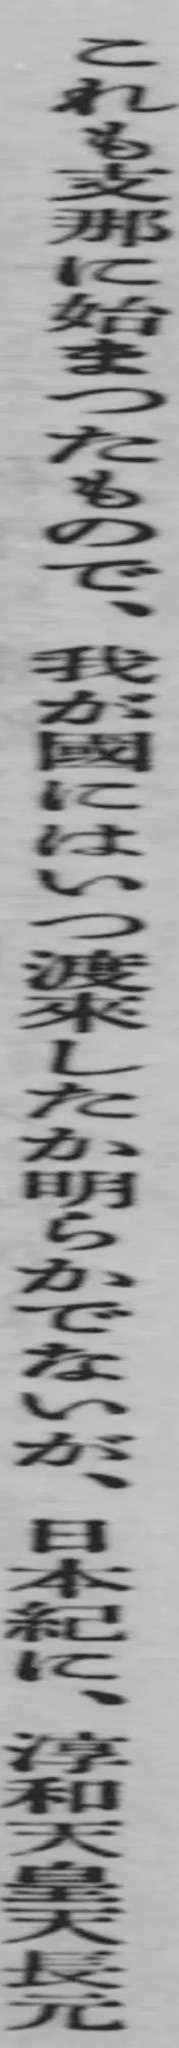これも支那で始まつたもので、我が國にはいつ渡來したか明らかでないが、日本紀に、淳和天皇天長元
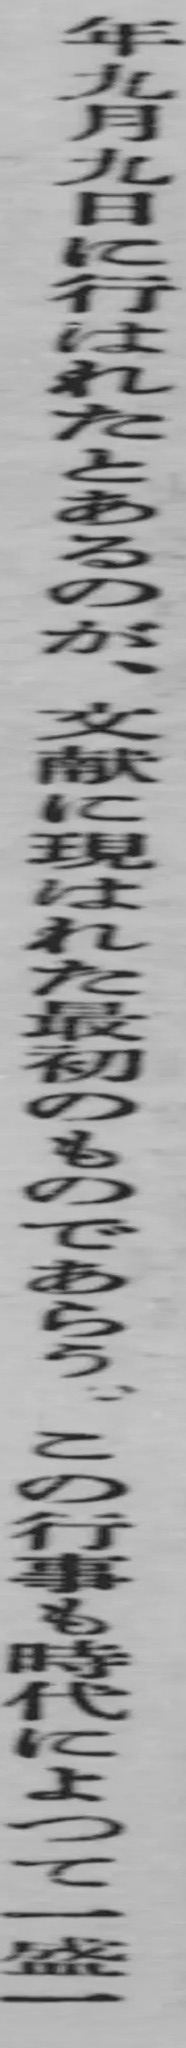年九月九日に行はれたとあるのが、文献に現はれた最初のものであらう。この行事も時代によつて一盛一
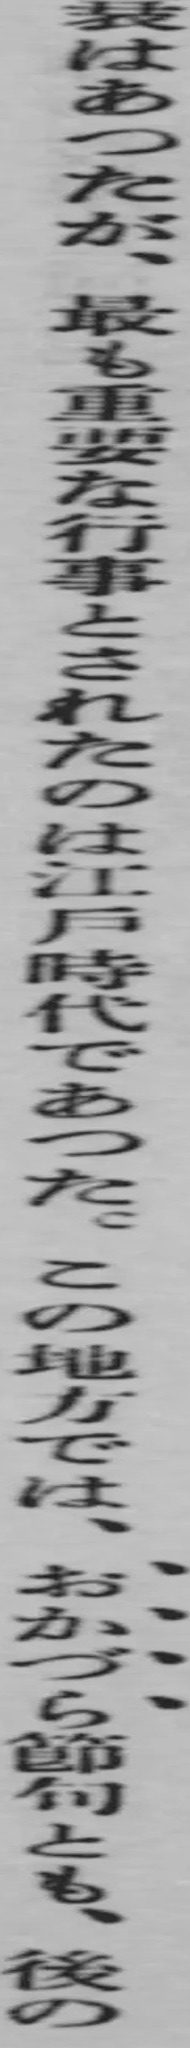衰はあつたが、最も重要な行事とされたのは江戸時代であつた。この地方では、おかづら節句とも、後の
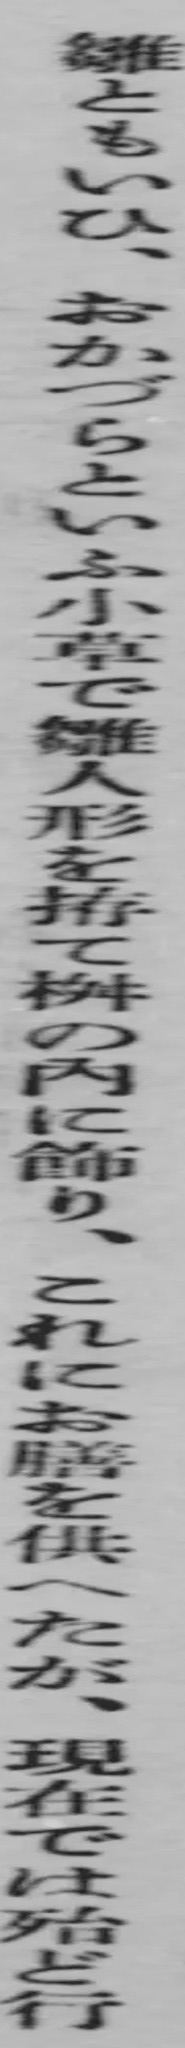雛ともいひ、おかづらといふ小草で雛人形を拵て桝の内に飾り、これにお膳を供へたが、現在では殆ど行
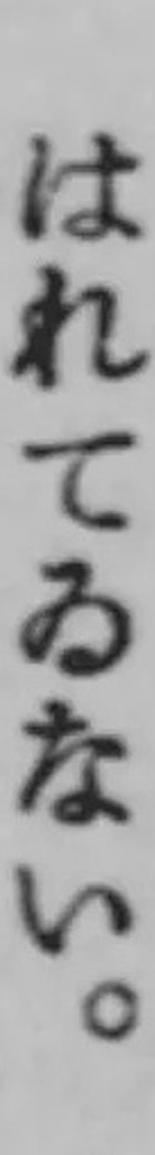はれてゐない。
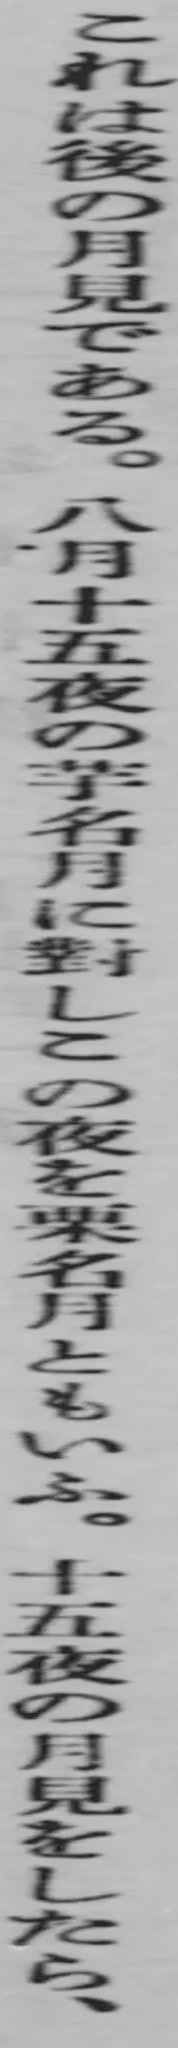これは後の月見である。八月十五夜の芋名月に對しこの夜を栗名月ともいふ。十五夜の月見をしたら、
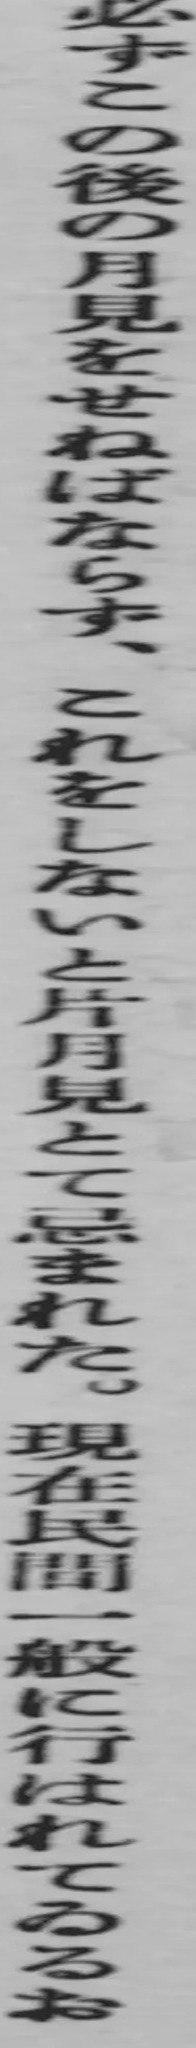必ずこの後の月見をせねばならず、これをしないと片月見とて忌まれた。現在民間一般に行はれてゐるお
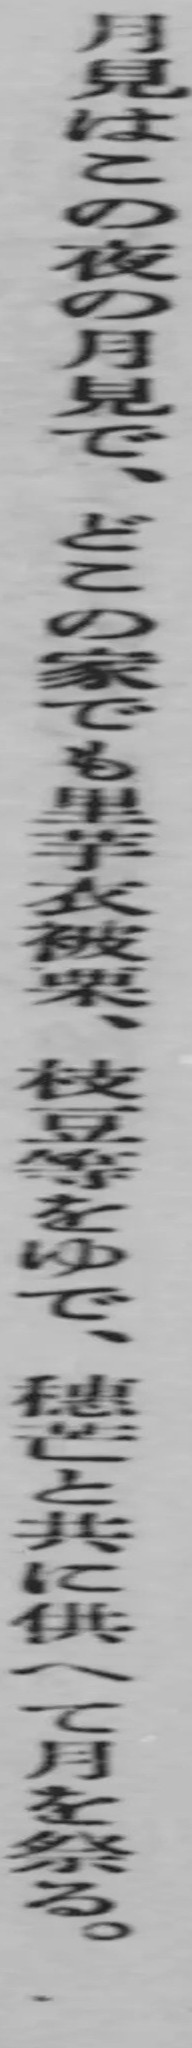月見はこの夜の月見で、どこの家でも里芋衣被栗、枝豆等をゆで、穗芒と共に供へて月を祭る。

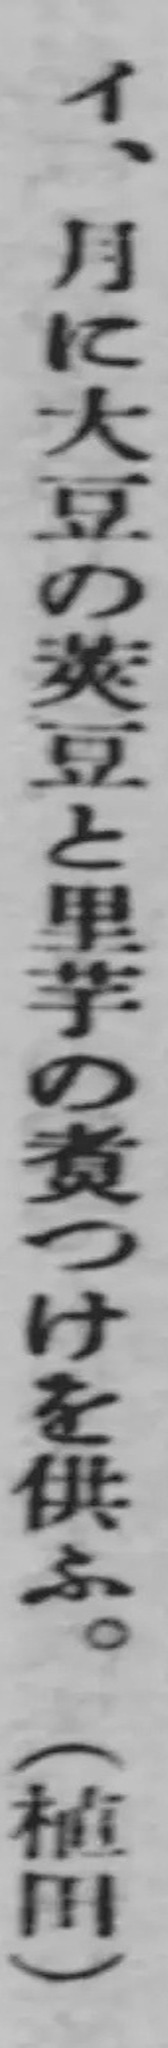イ、月に大豆の莢豆と里芋の煑つけを供ふ。(植田)
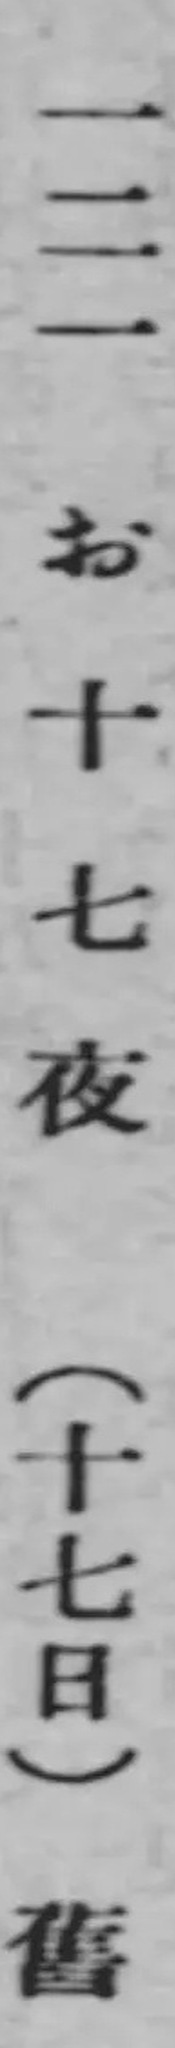一二一お十七夜(十七日)舊
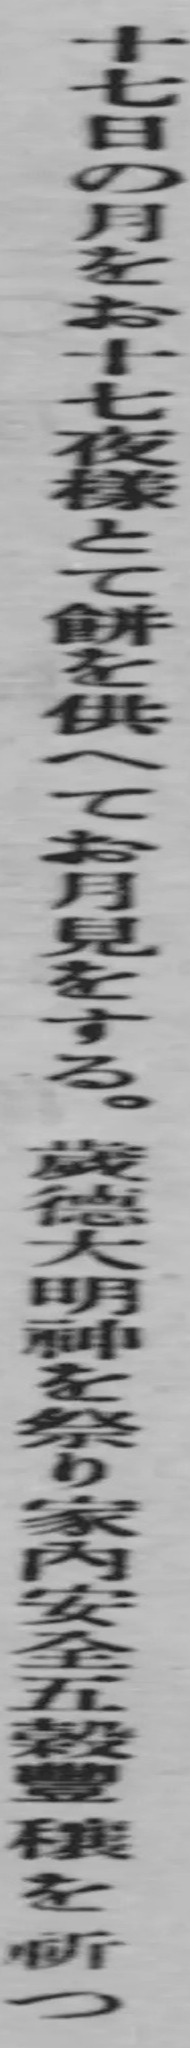十七日の月をお十七夜様とて餅を供へてお月見をする。歲德大明神を祭り家内安全五穀豐穰を祈つ
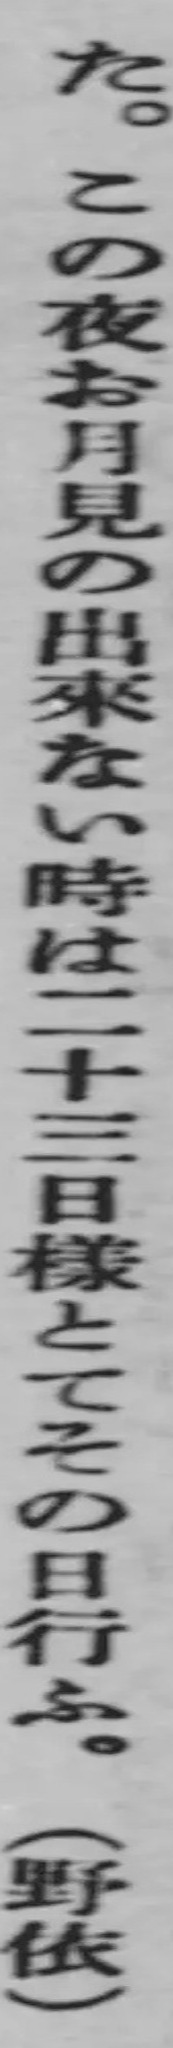た。この夜お月見の出來ない時は二十三日様とてその日行ふ。(野依)
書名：豊橋の年中行事
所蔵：国立国会図書館 National Diet Library, JAPAN
